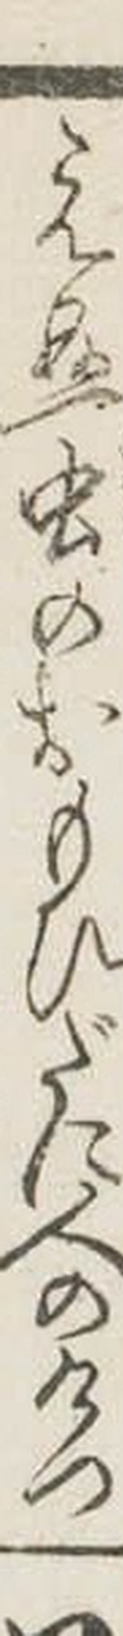えぬ虫のおもひだに人のけつ
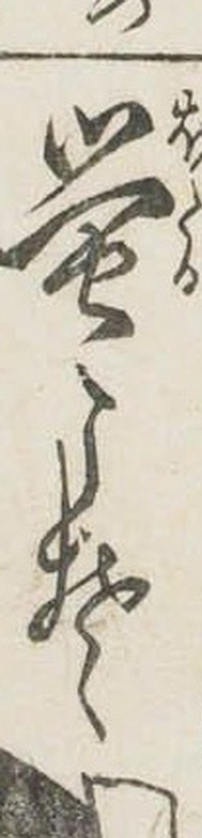蛍こそ
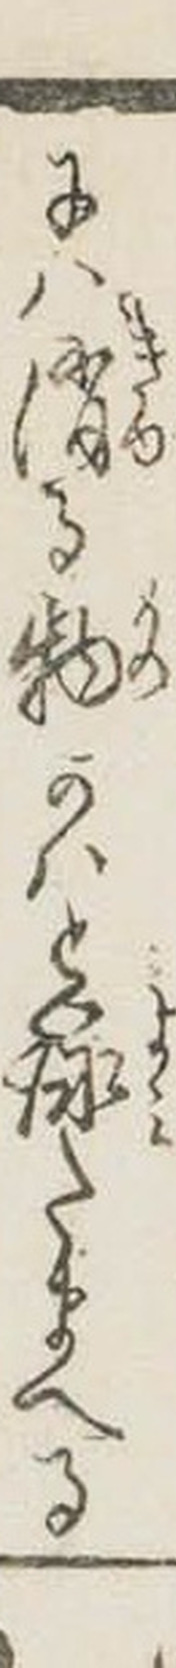には消る物かはと詠たまへる
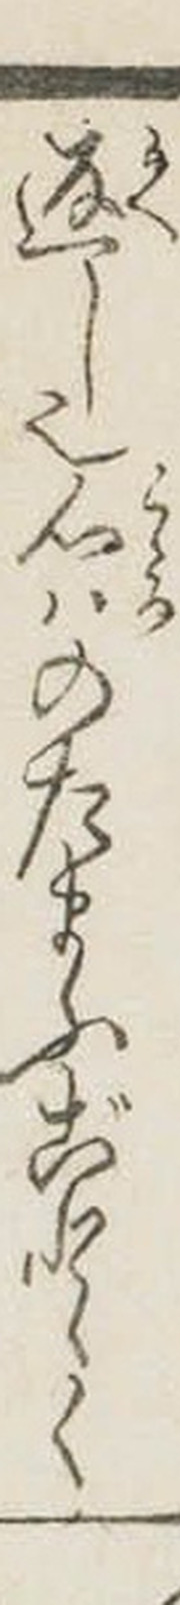返し也心はのたまふごとく
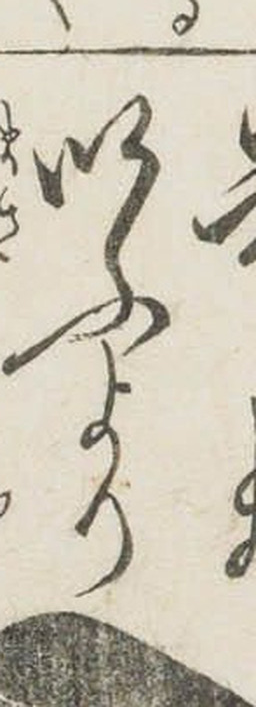いふより
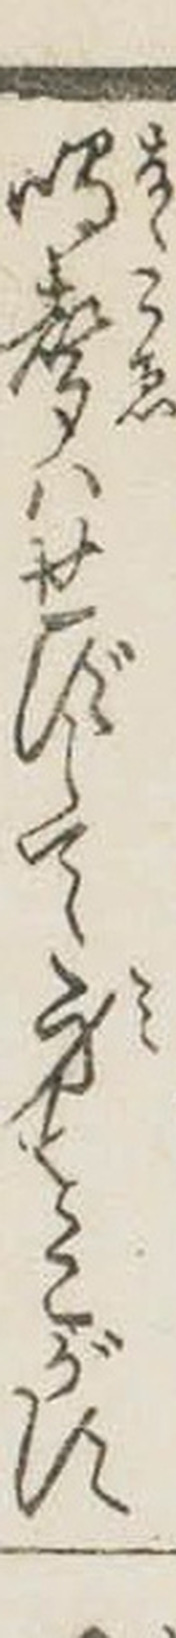鳴声はせずして身をこがす
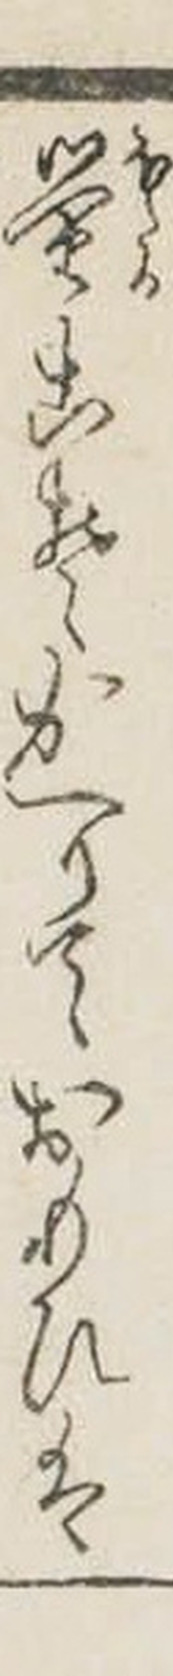蛍こそかへりておもひは
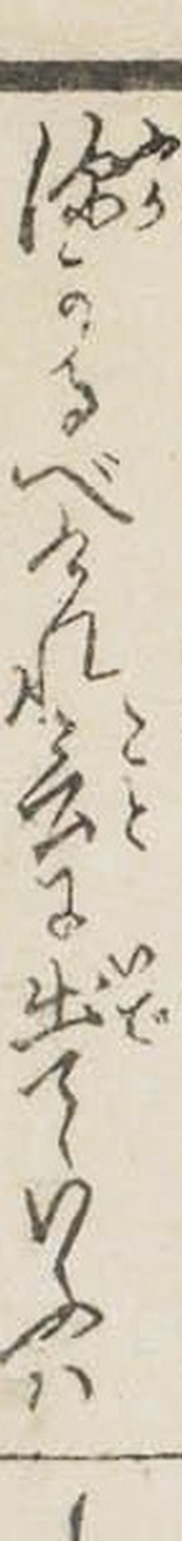深かるべけれ言に出ていふは
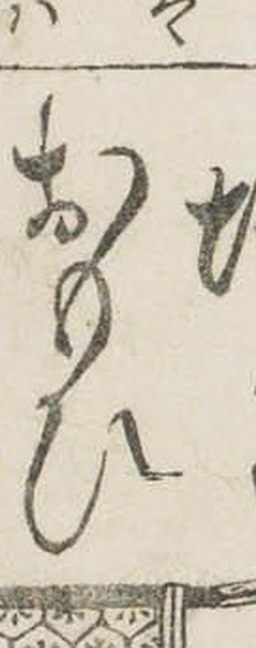おもひ
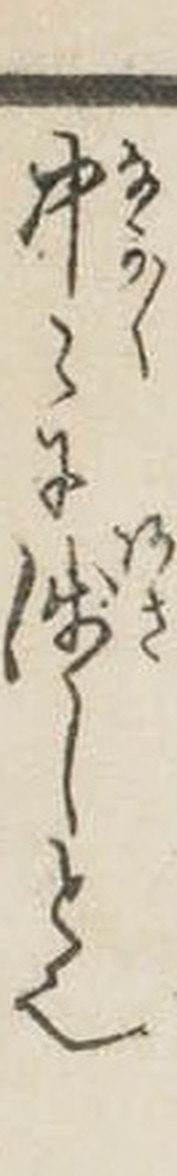中々に浅しと也

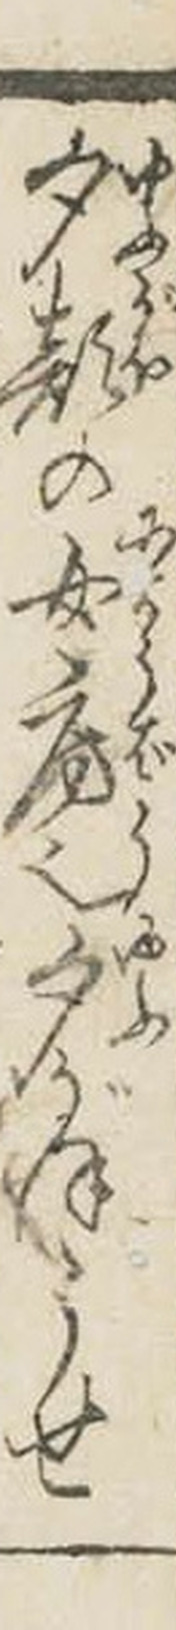夕顔の女房也夕がほうせ
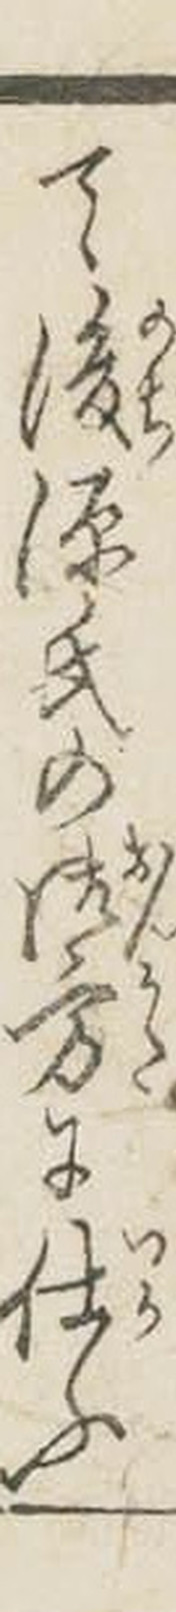て後源氏の御方に仕ふ
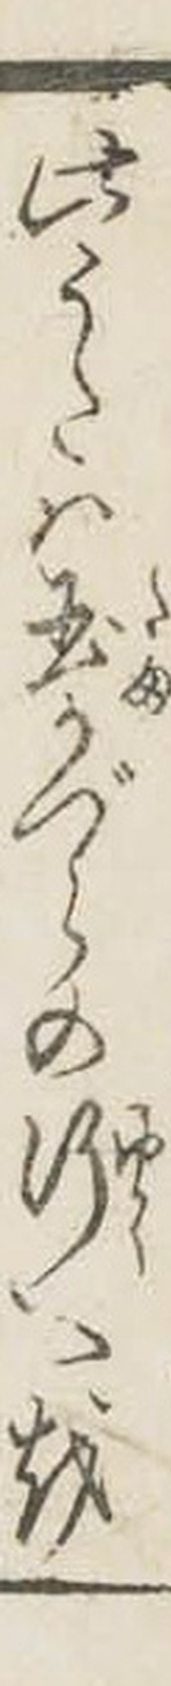此うたは玉かづらの行へを
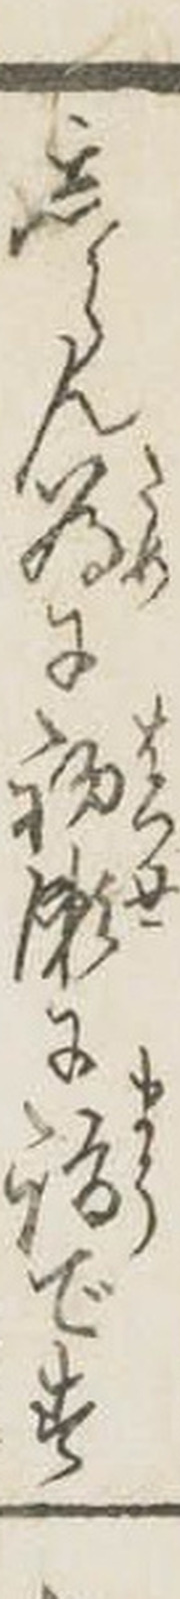しらん為に初瀬に詣です
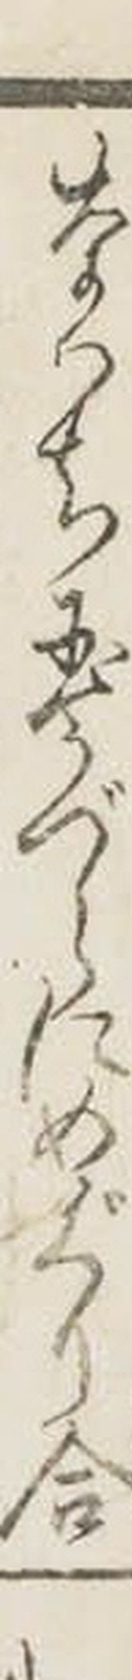なはち玉かづらにめぐり合
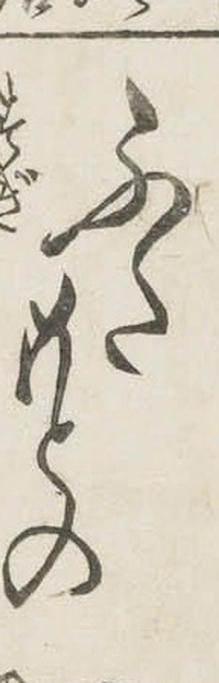ふたもとの
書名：源氏百人一首
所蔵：東京学芸大学教育コンテンツアーカイブ
